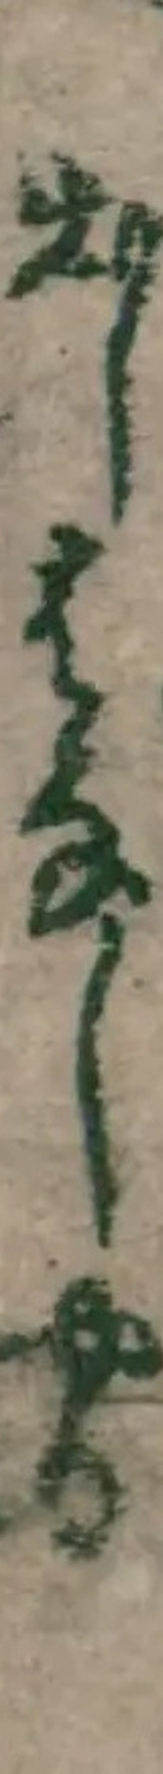出しはなしやる
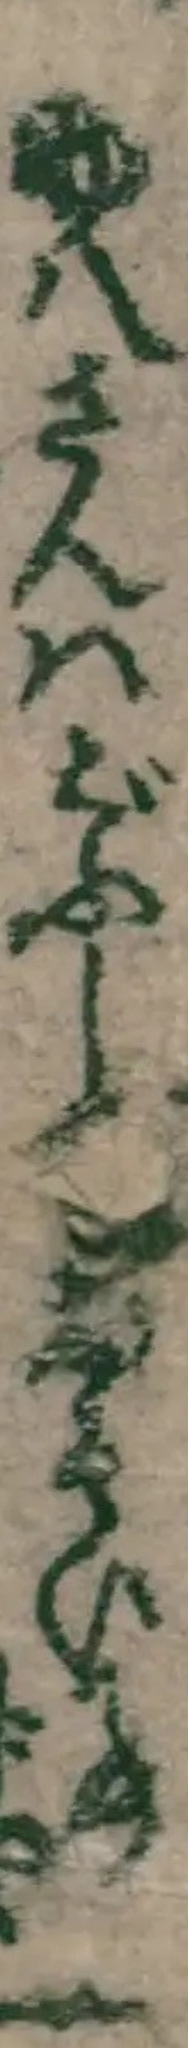助八さんどふしおそい事
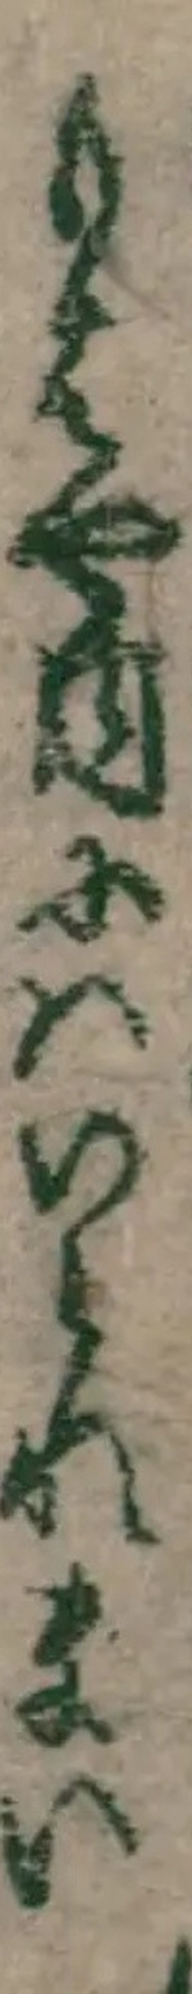のはや内にはいられまい
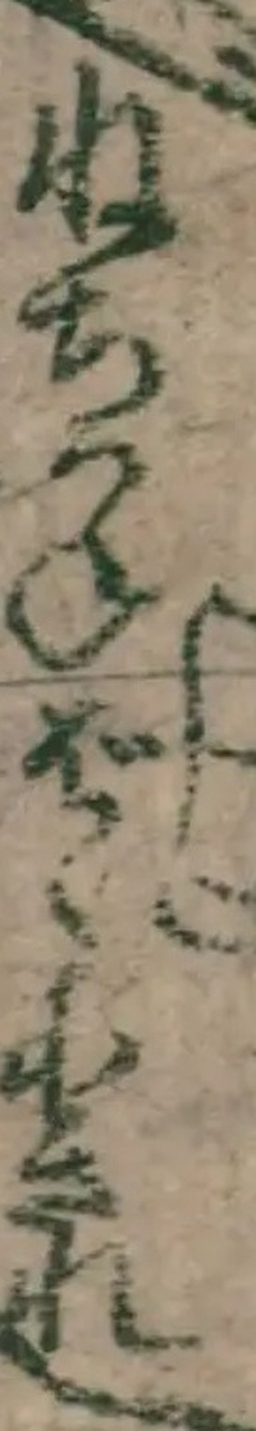ねちかねばゝあきれ
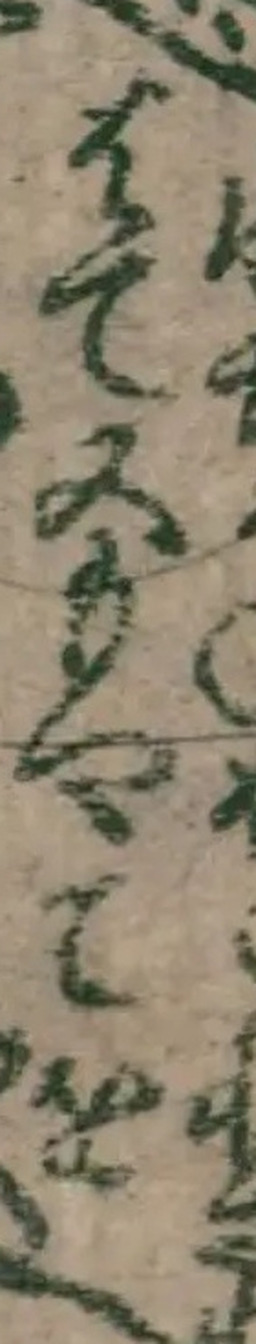はて又もやてを
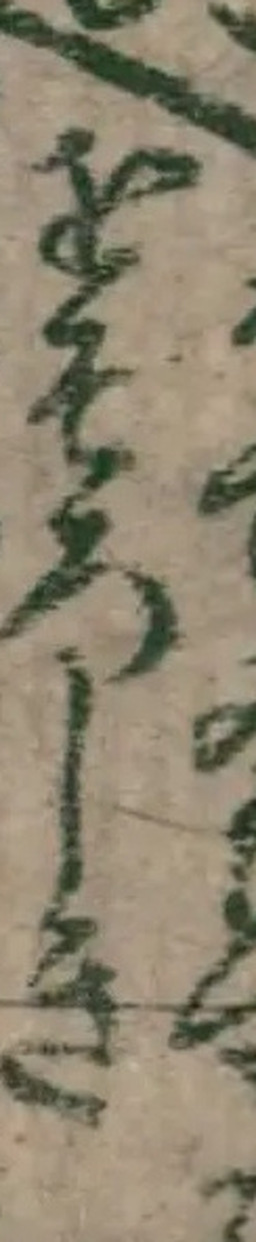おそろしき
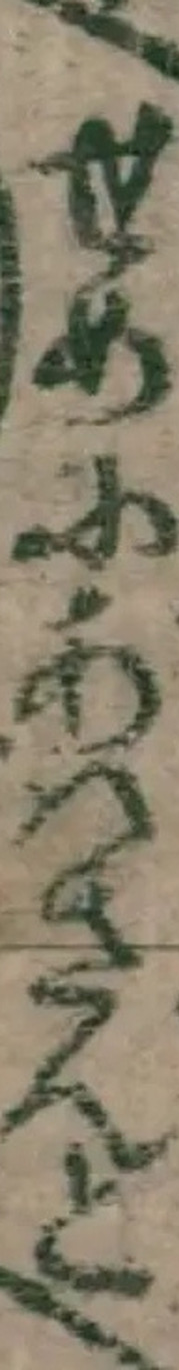せめにあはさんと
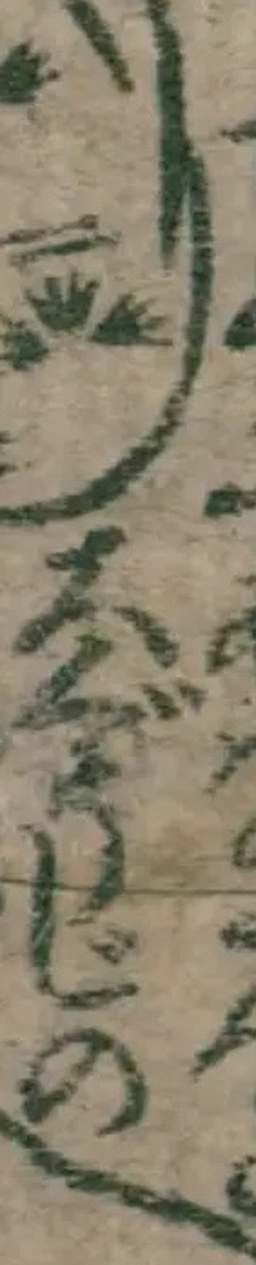大ぐうじの
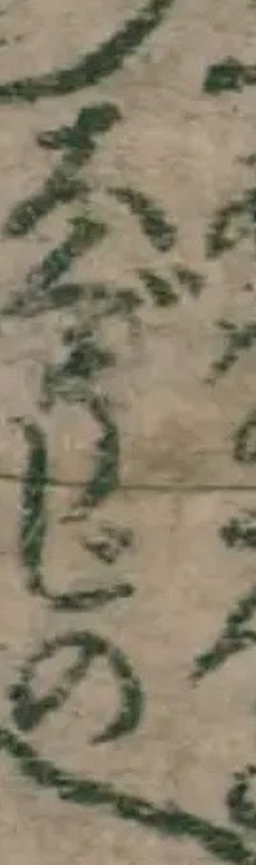大ぐうじの
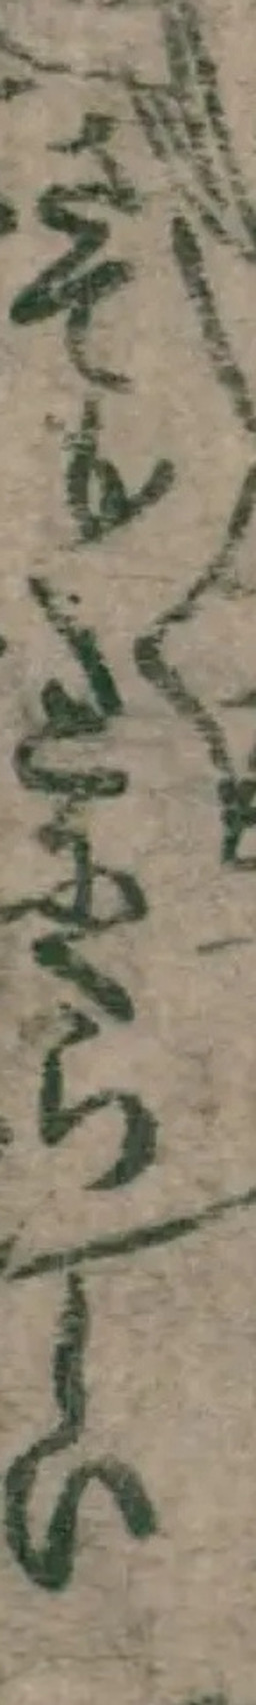さても〳〵こにくらしい
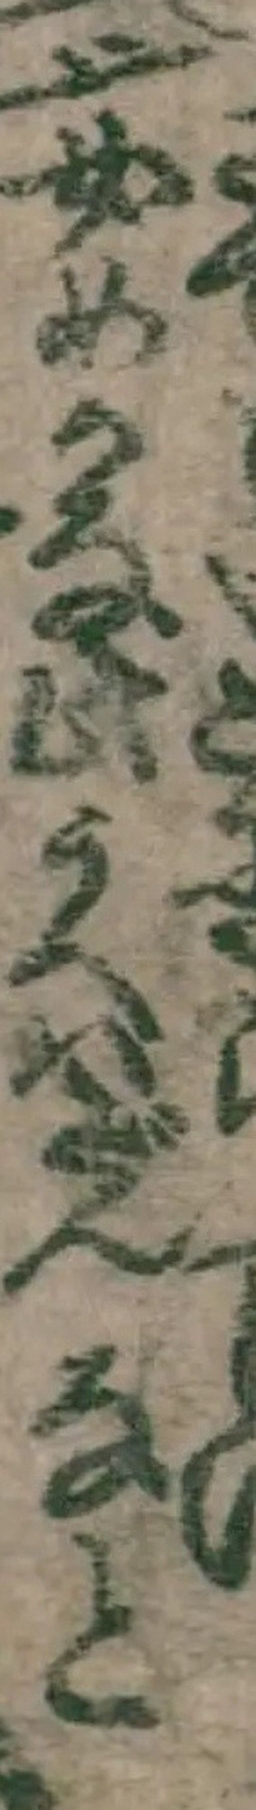女めかな此うへはだんなと
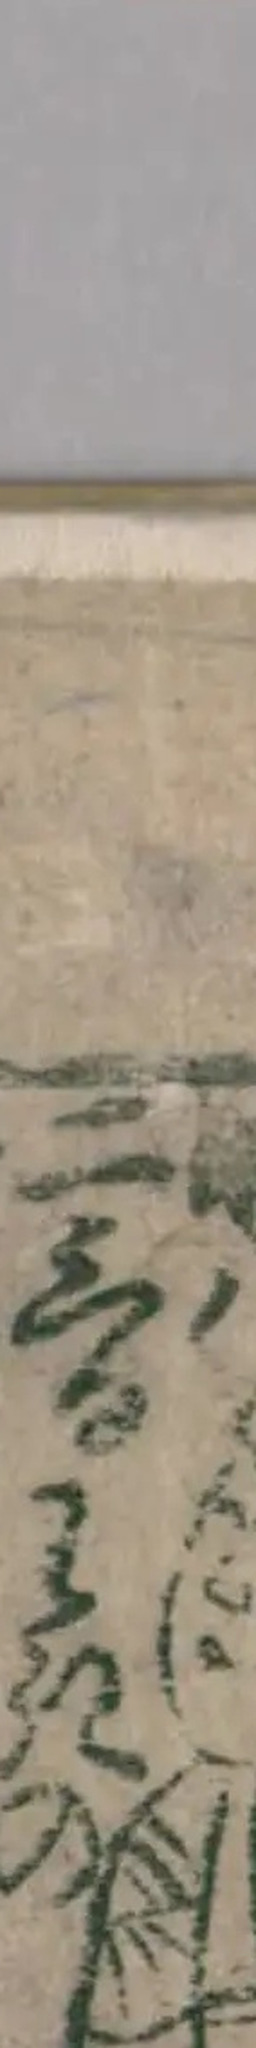二三日わきの
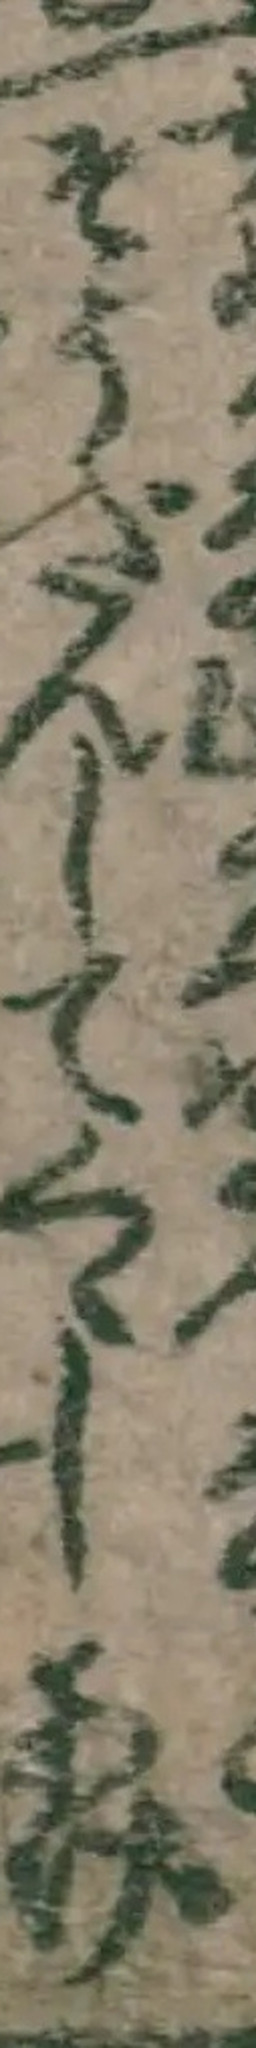そうだんしてくゝしあげ
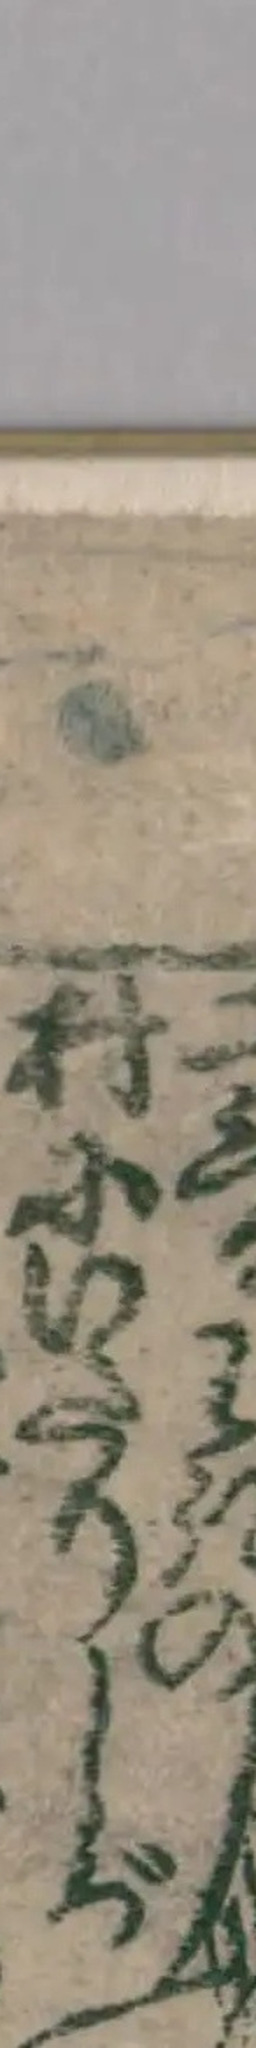村にいたりしが
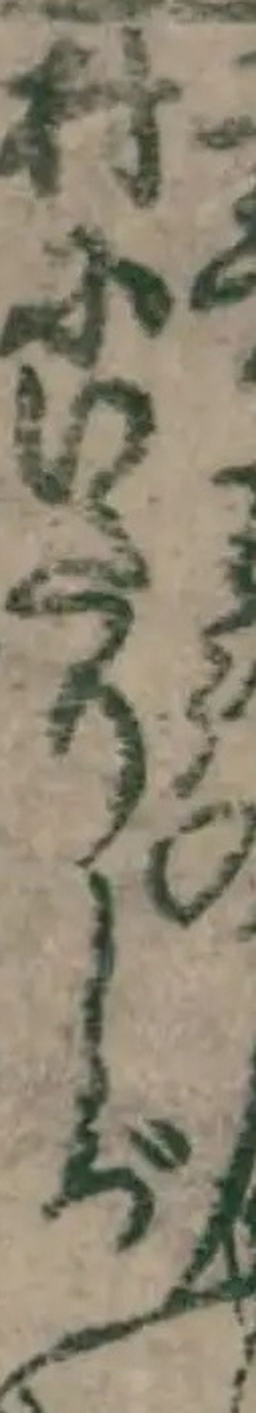村にいたりしが
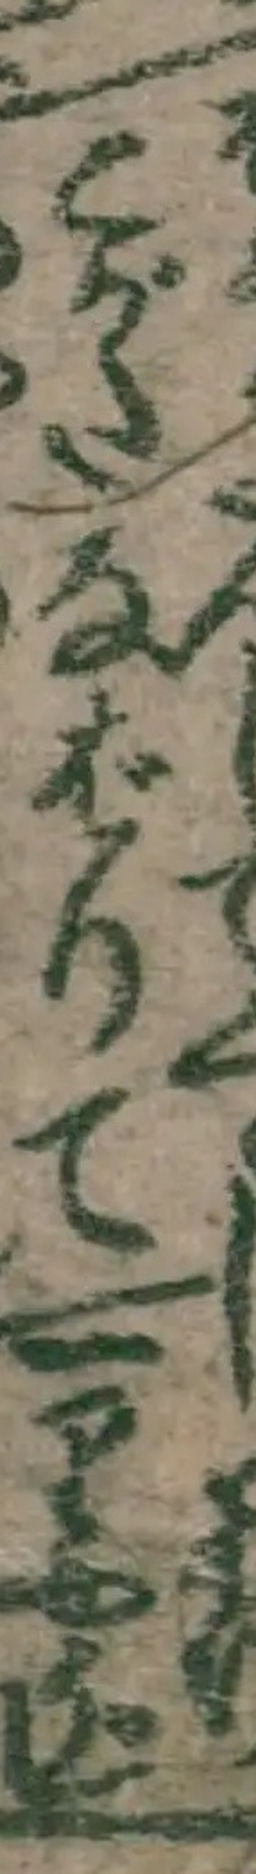こがたなばりで一りやうじ
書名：塩売文太物語 2巻
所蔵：国立国会図書館 National Diet Library, JAPAN
